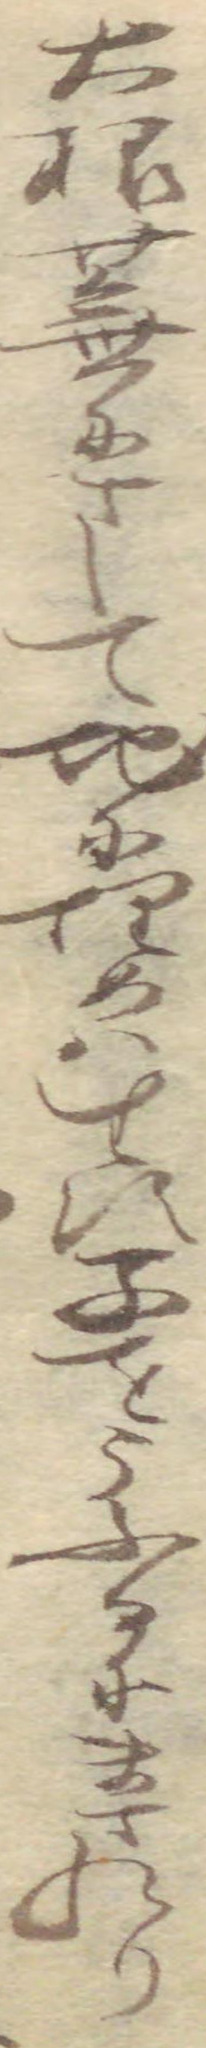大根蕪にさして地に埋めハ生す子をうふるにまされり
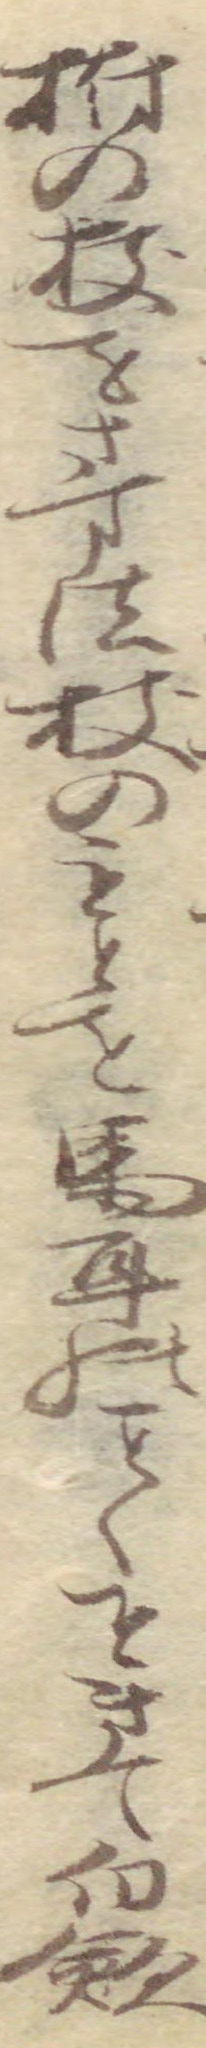一樹の枝をさす法枝のもとを馬耳のことくそきて白斂
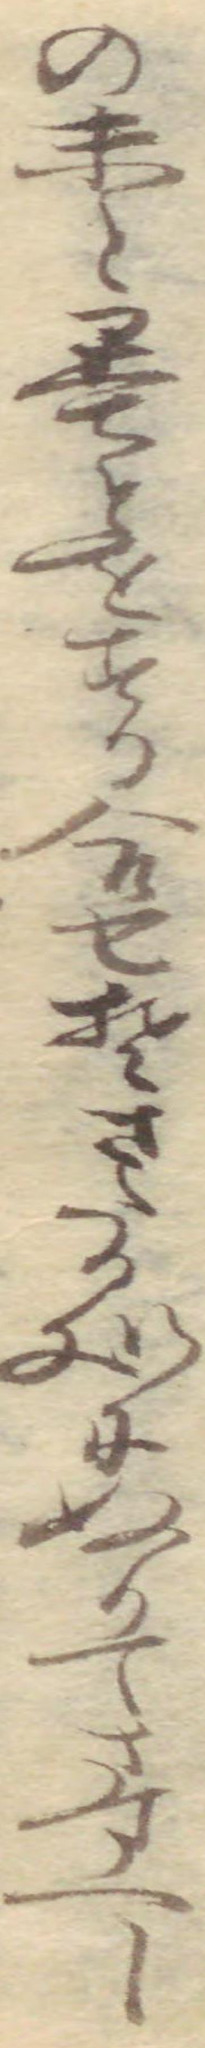の末と黒土とをすり合せそきたる処にぬりてさすへし
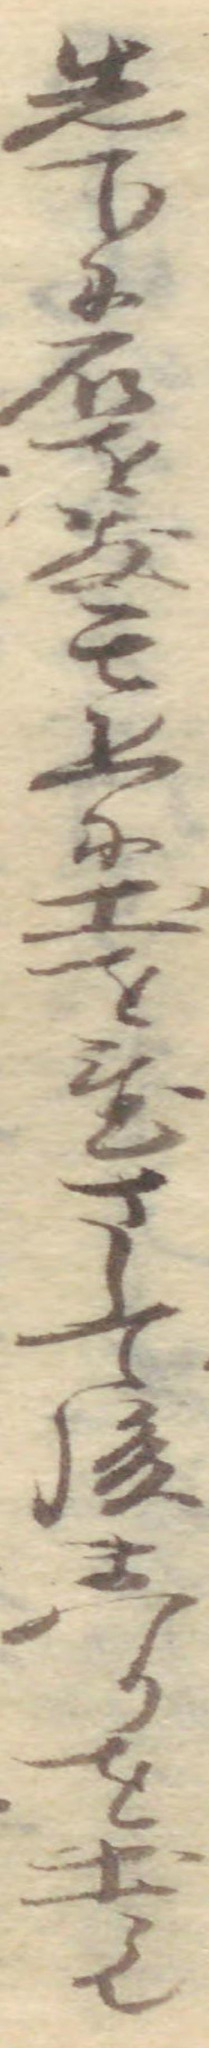先下に石を敷其上に土を置さして後まハりを土二て
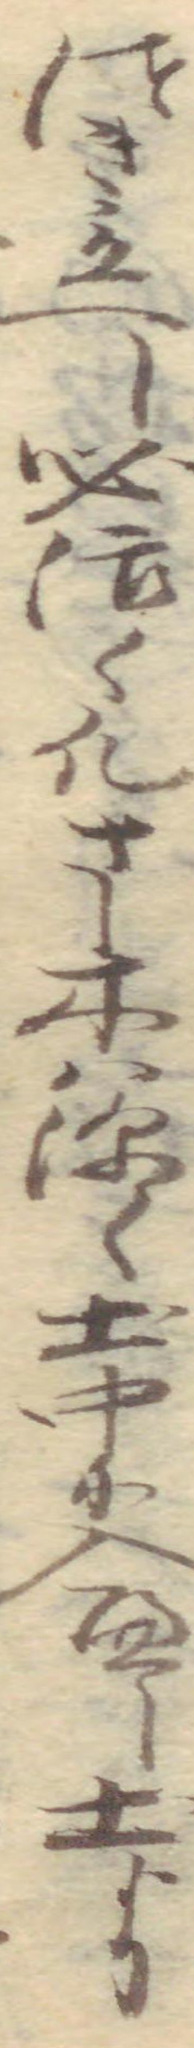つき立へし必活く凡そさし木ハふか深く土中に入へし土より
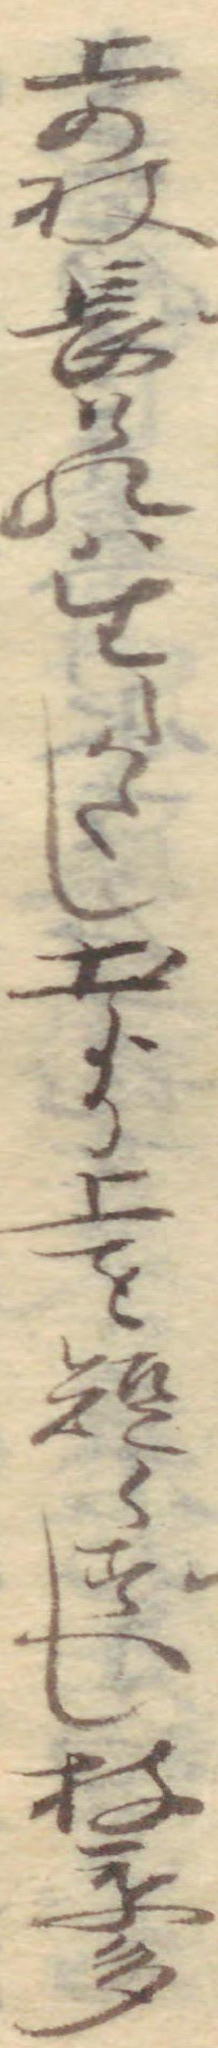上の枝長けれハ生しかたし土より上を短くすへし枝葉多
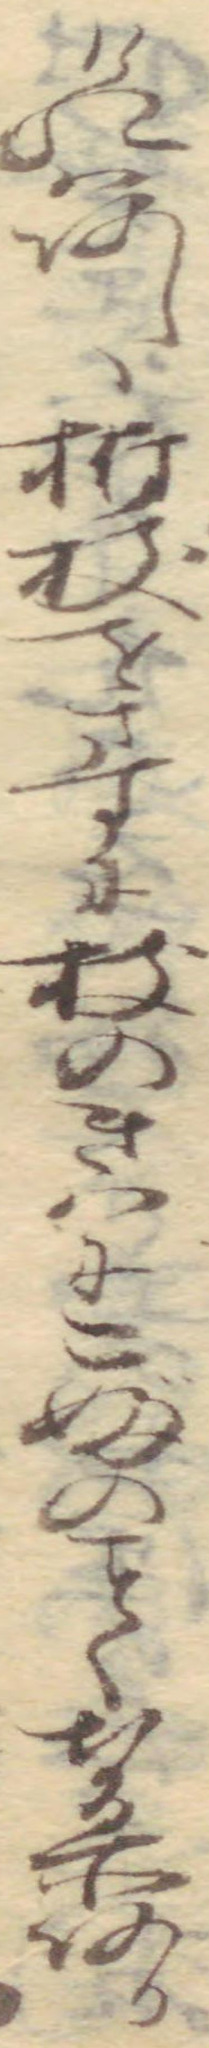けれハあし也樹枝をさすに枝のきハにこぶのことくなる所あり
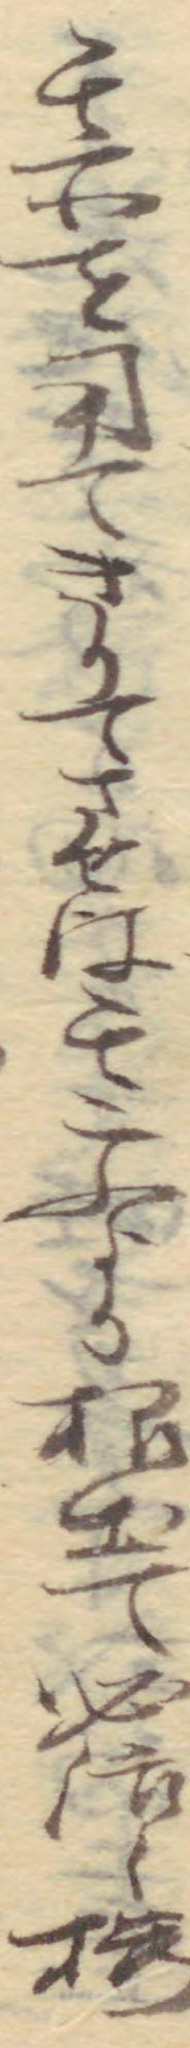其所を用てきりてさせは其こふより根出て必活く梅
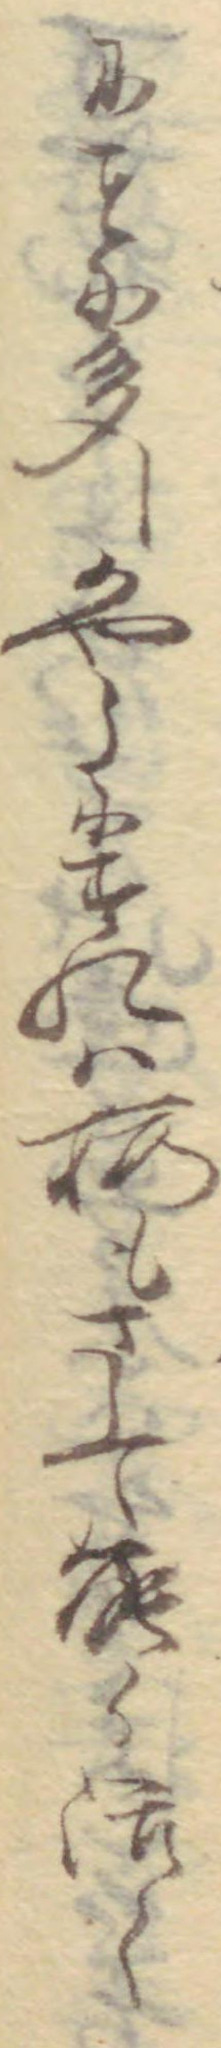にことに多しかやうにすれハ梅もさしてよく活く
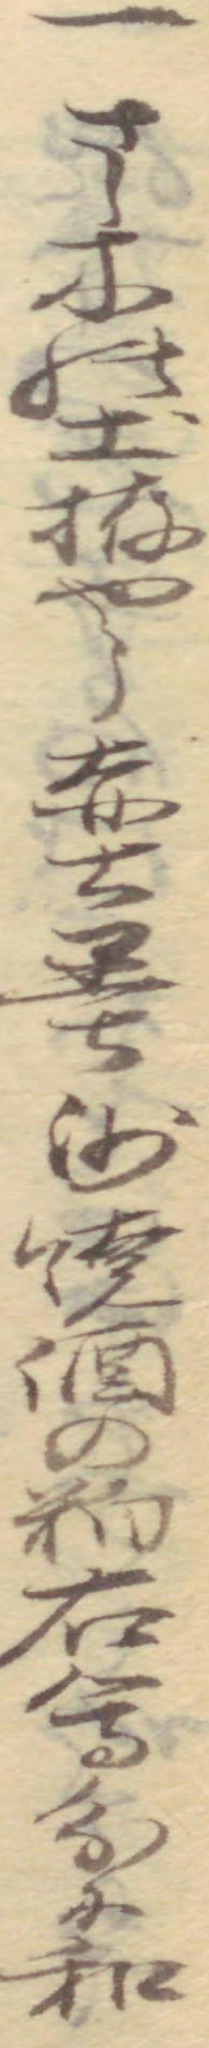一さし木の土拵やう赤土黒土沙焼酒の粕右等分に和
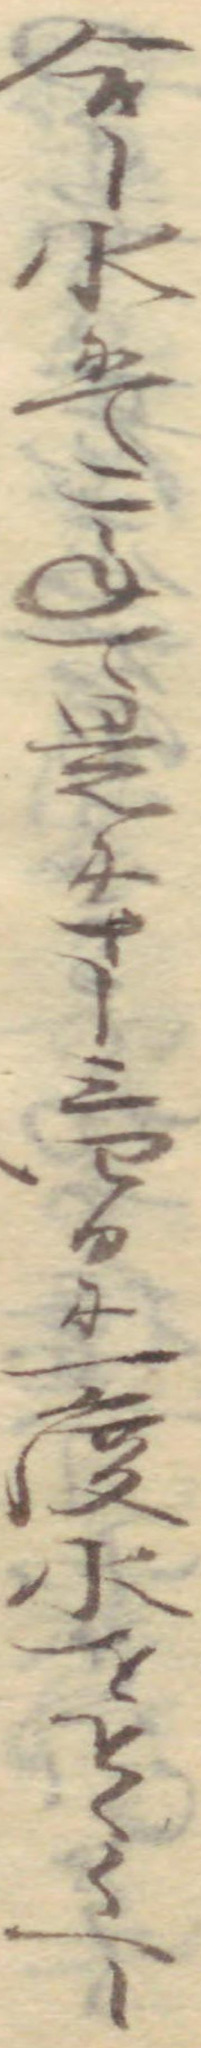合し水にてこねて是にさし三四日に一度水をそゝくへし
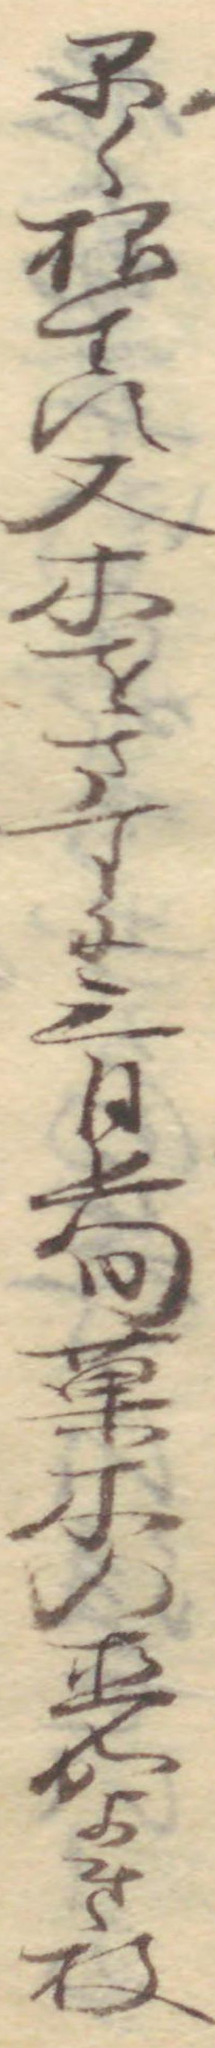早く根生す又木をさすに三月上旬菓木の直成よき枝
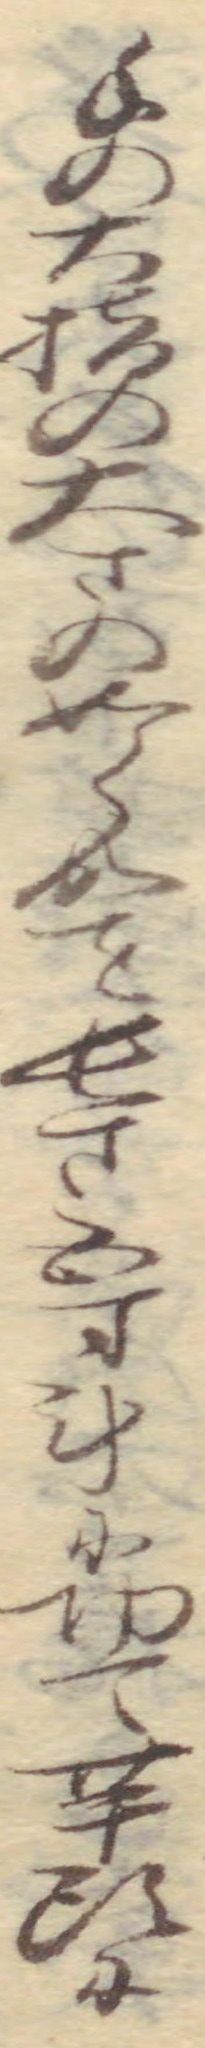手の大指の大さの如く成を長さ五寸斗に切て芋頭に
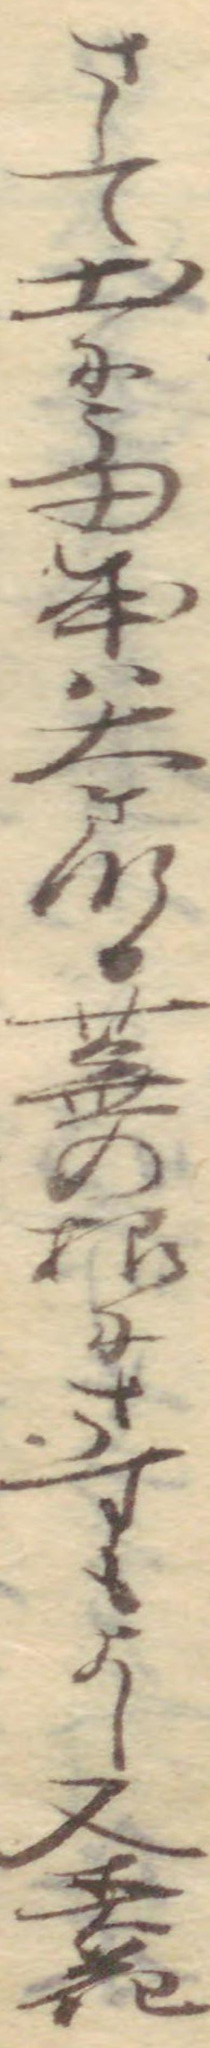さして土にうゆ或ハ大きなる蕪の根にさすもよし又春花
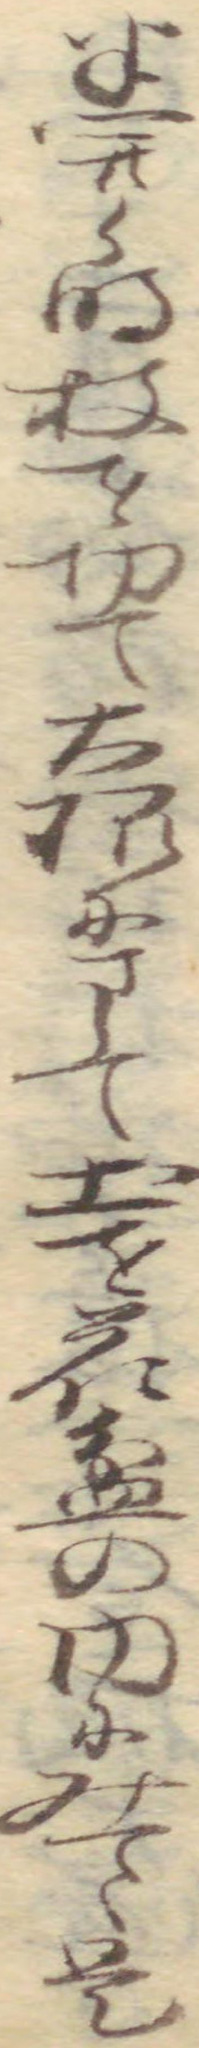半開く時枝を切て大根にさして土を花盆の内にみてゝ是
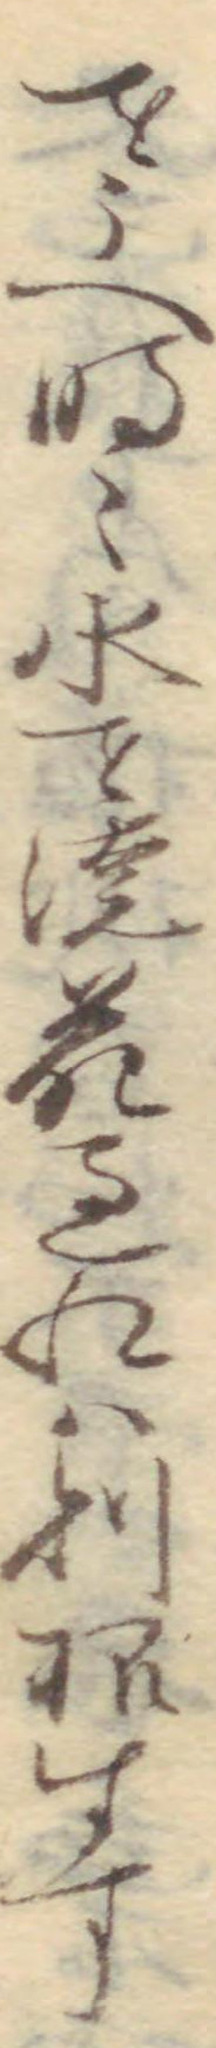をうへ時々水を澆花過れハ別根生す
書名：鶯宿雑記. 巻199-200
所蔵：国立国会図書館 National Diet Library, JAPAN
